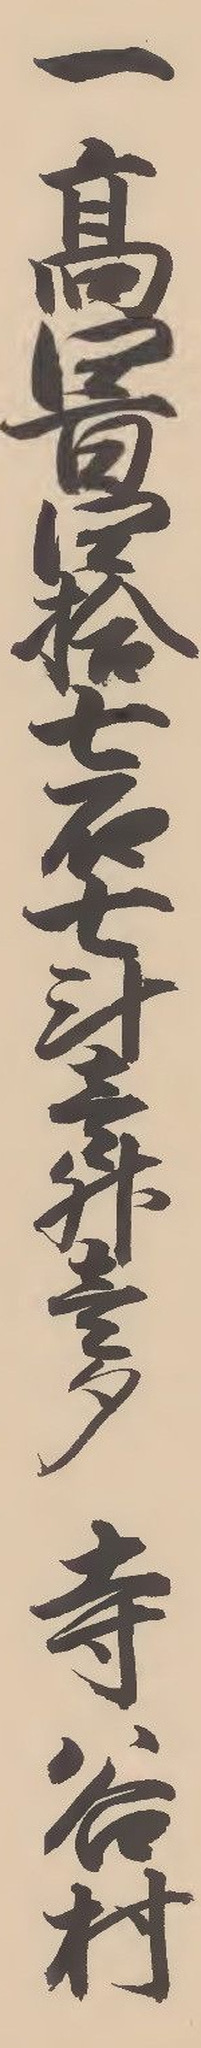一高四百四拾七石七斗壱升壱勺寺谷村
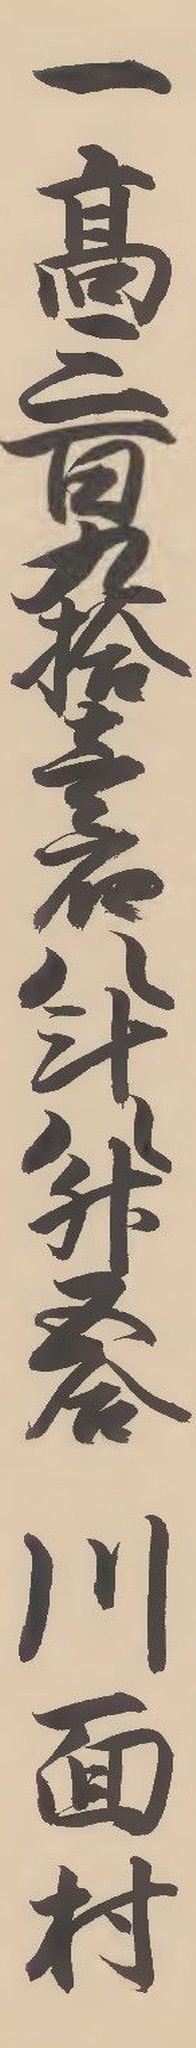一高三百九拾壱石八斗八升五合川面村
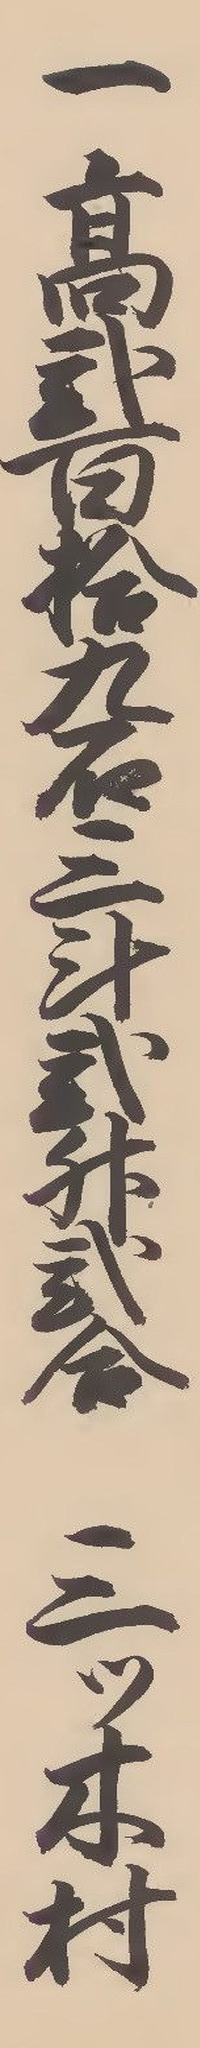一高弐百拾九石三斗弐升弐合三ッ木村

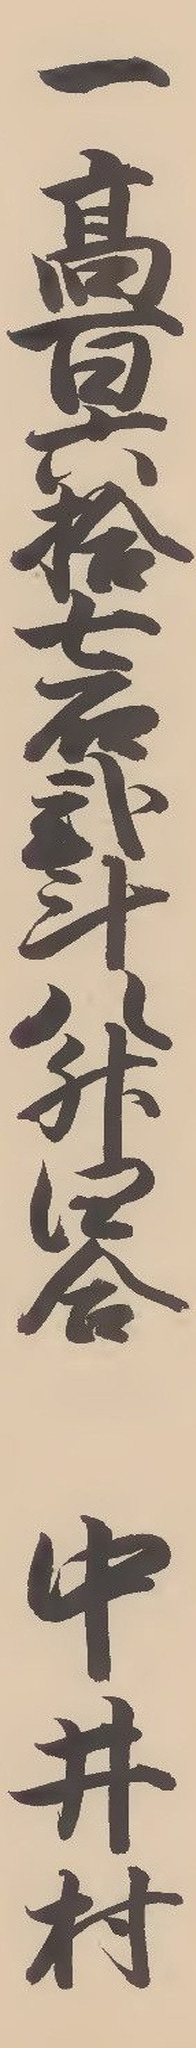一高百六拾七石弐斗八升四合中井村
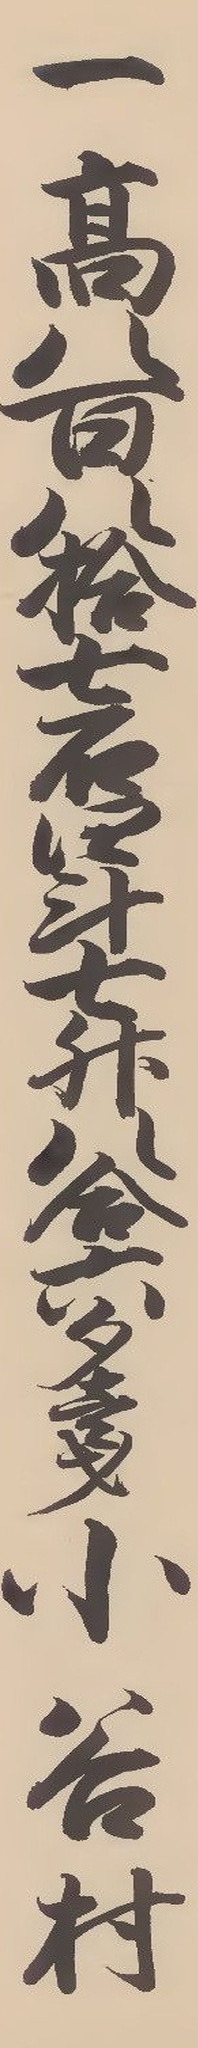一高八百八拾七石四斗七升八合六勺壱才小谷村
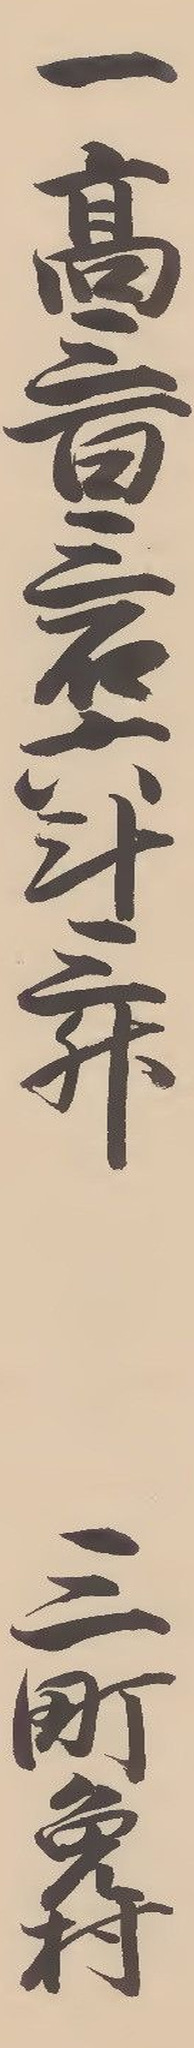一高三百三石六斗三升三町免村
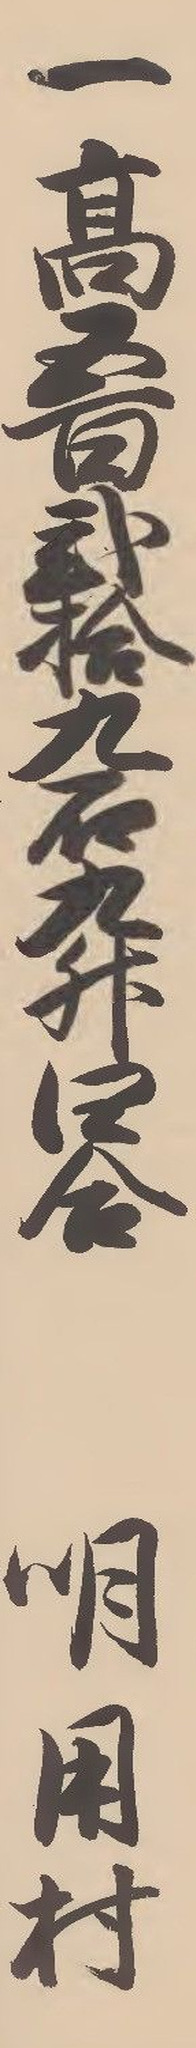一高五百弐拾九石九升四合明用村
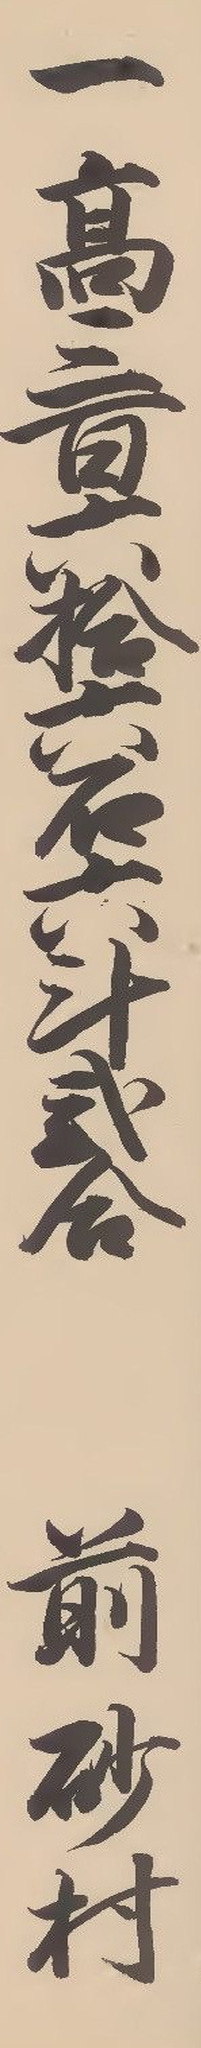一高三百六拾六石六斗弐合前砂村
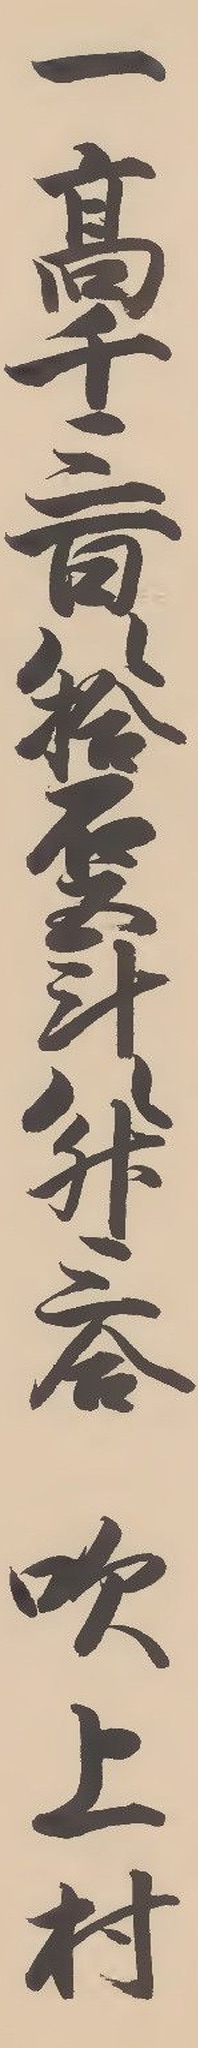一高千三百八拾石五斗八升三合吹上村
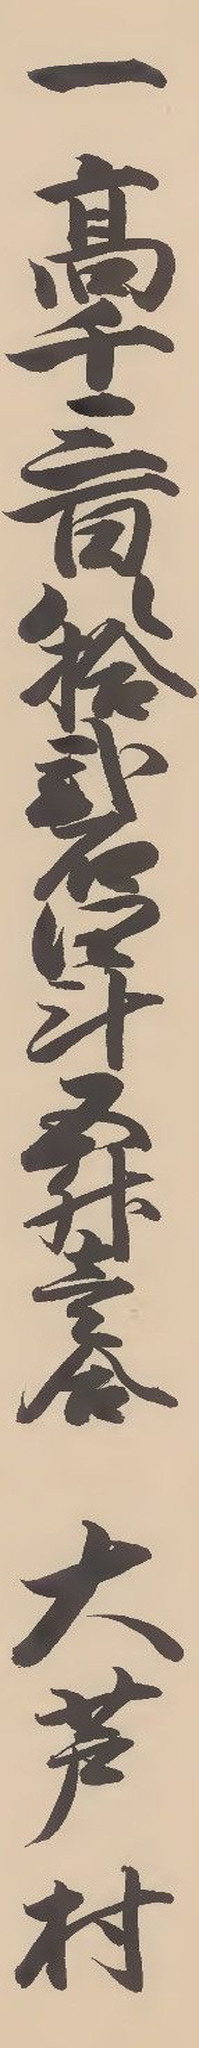一高千三百八拾弐石四斗五升壱合大芦村
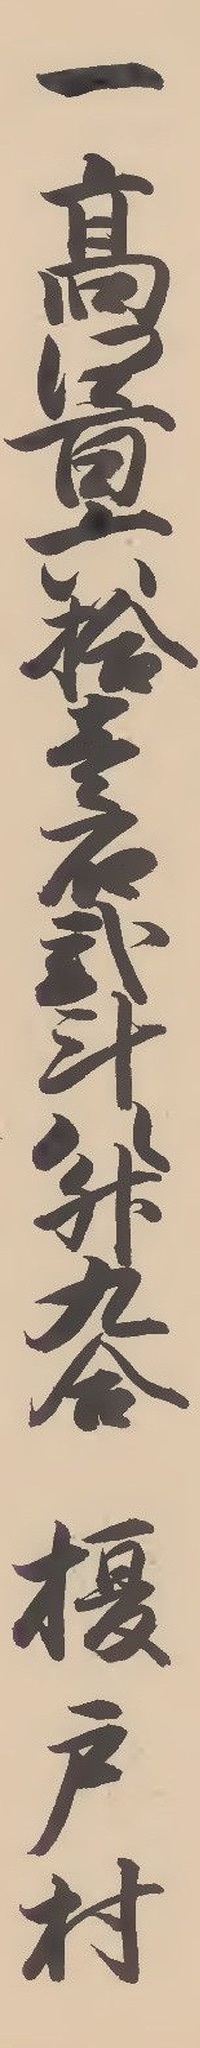一高四百六拾壱石弐斗八升九合榎戸村

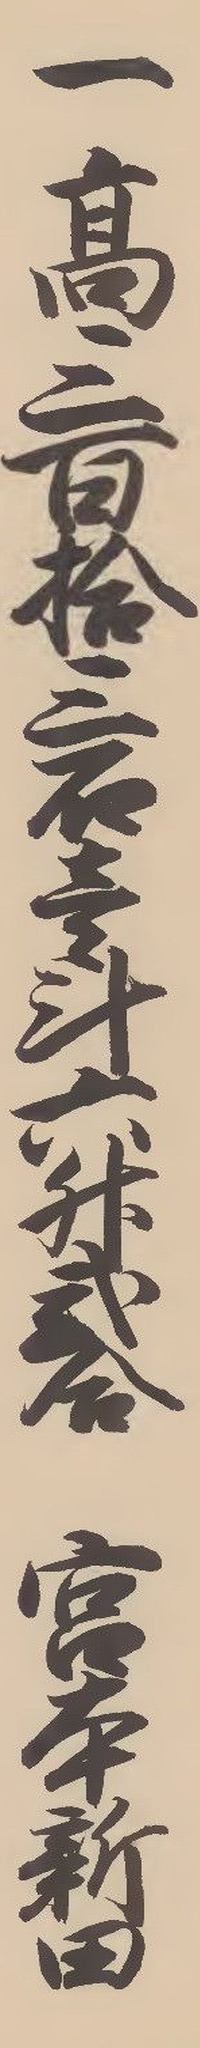一高三百拾三石壱斗六升弐合宮本新田
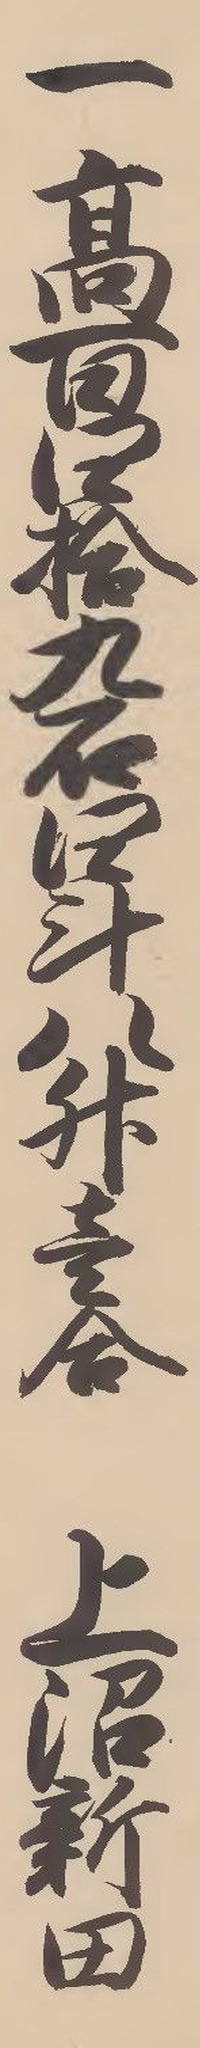一高百四拾九石四斗八升壱合上沼新田
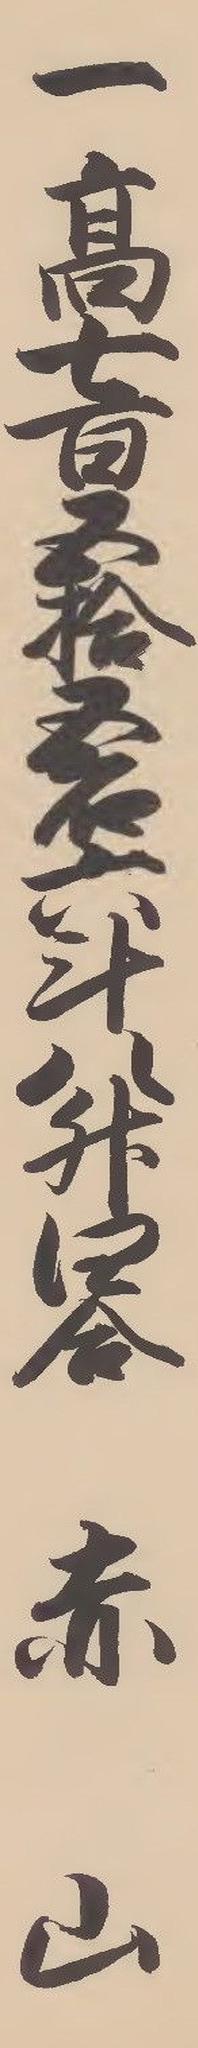一高七百五拾五石六斗八升四合赤山
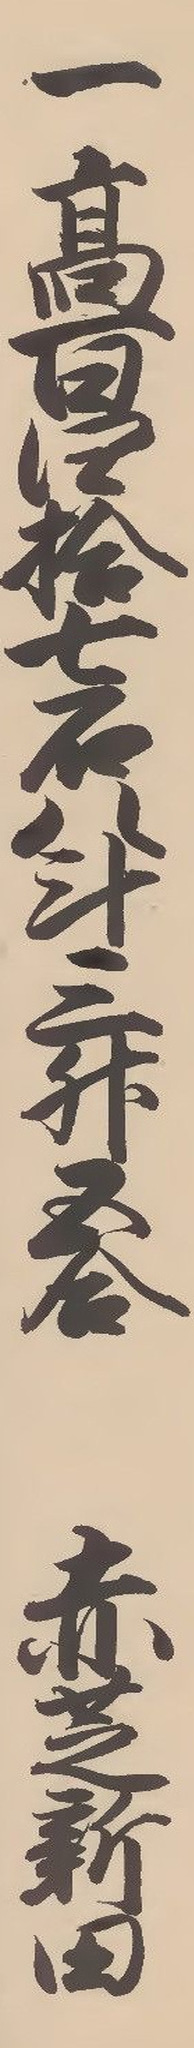一高百四拾七石八斗三升五合赤芝新田
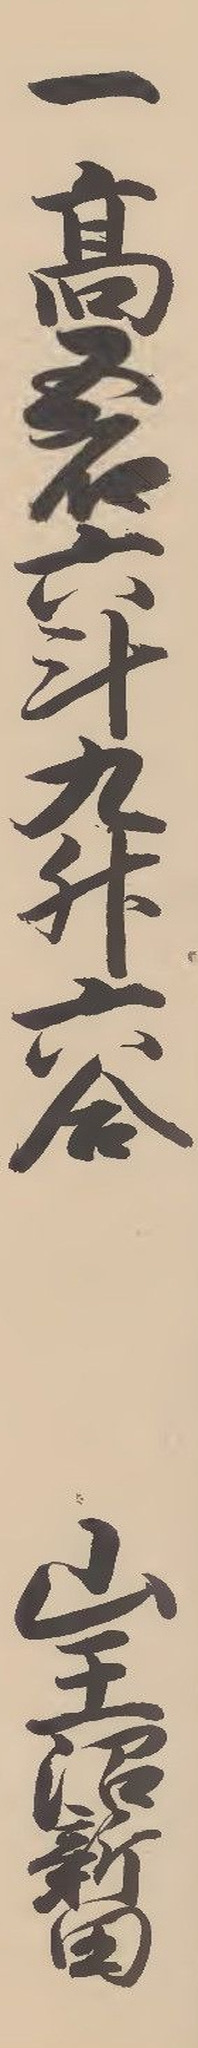一高五石六斗九升六合山王沼新田
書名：武蔵国郷帳　下
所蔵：国立公文書館 National Archives of Japan
